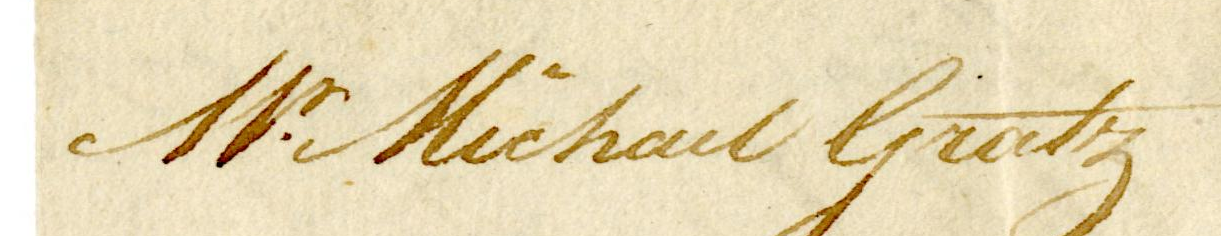M^r. Michael Gratz
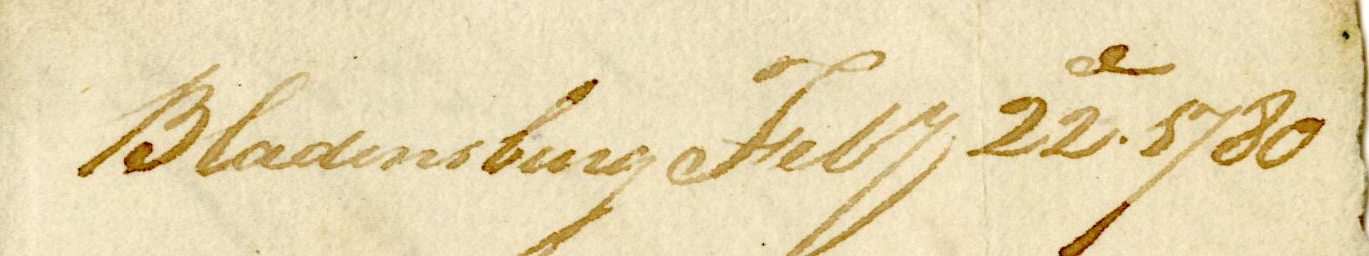Bladensburg Feb^y, 22^d 1780
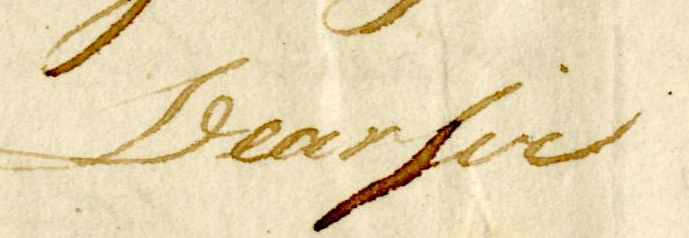Dear Sir
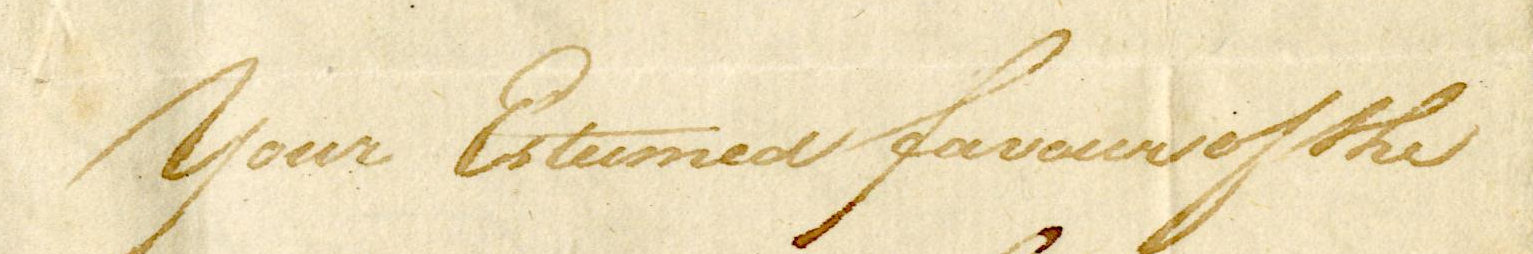Your Esteemed favour of the
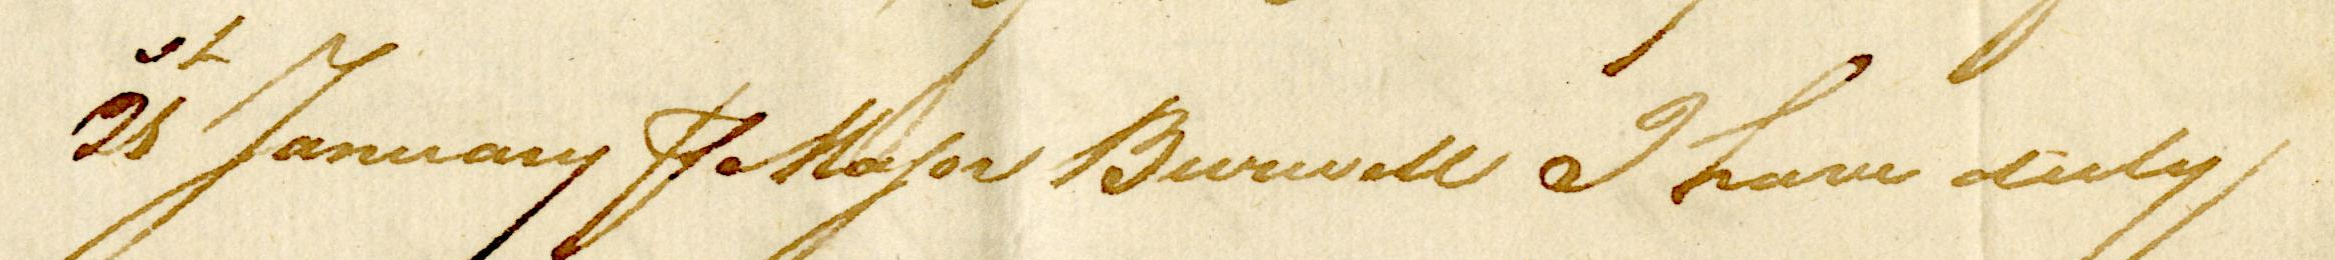21^st January per Major Burwell I have duly
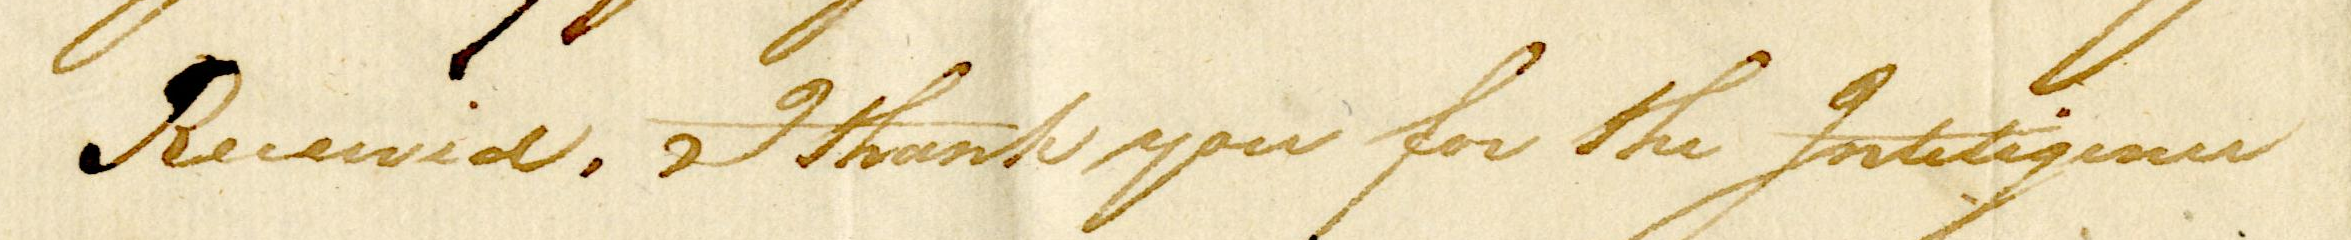Received, I thank you for the Inteligence
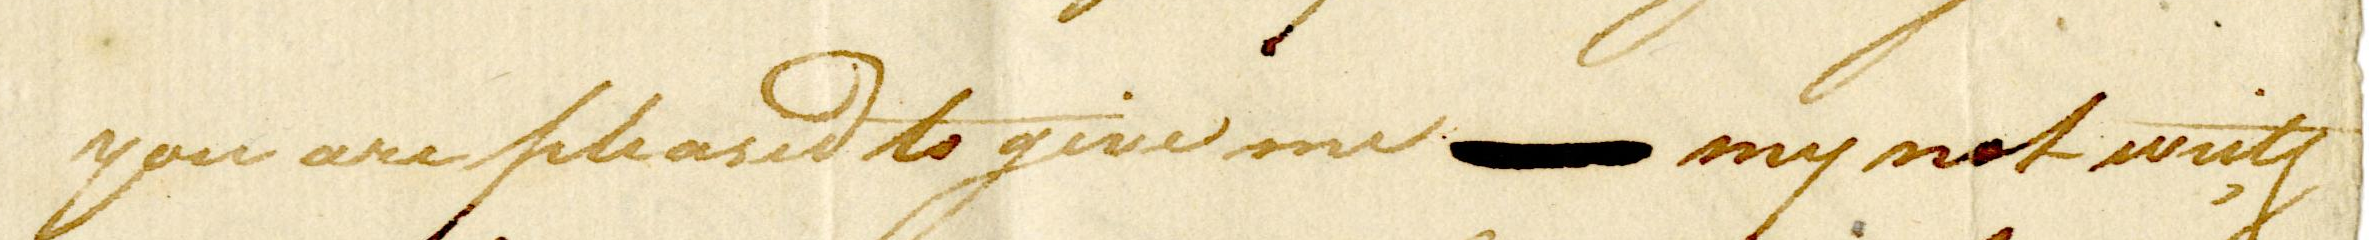you are pleased to give me- my not writg
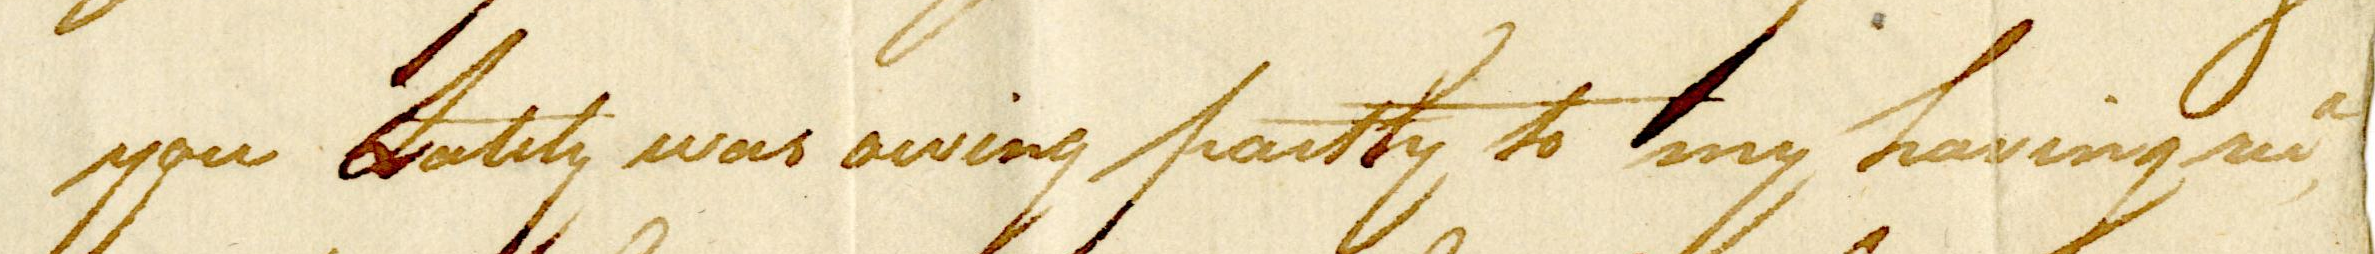you Latety was owing partly to my having rec^d
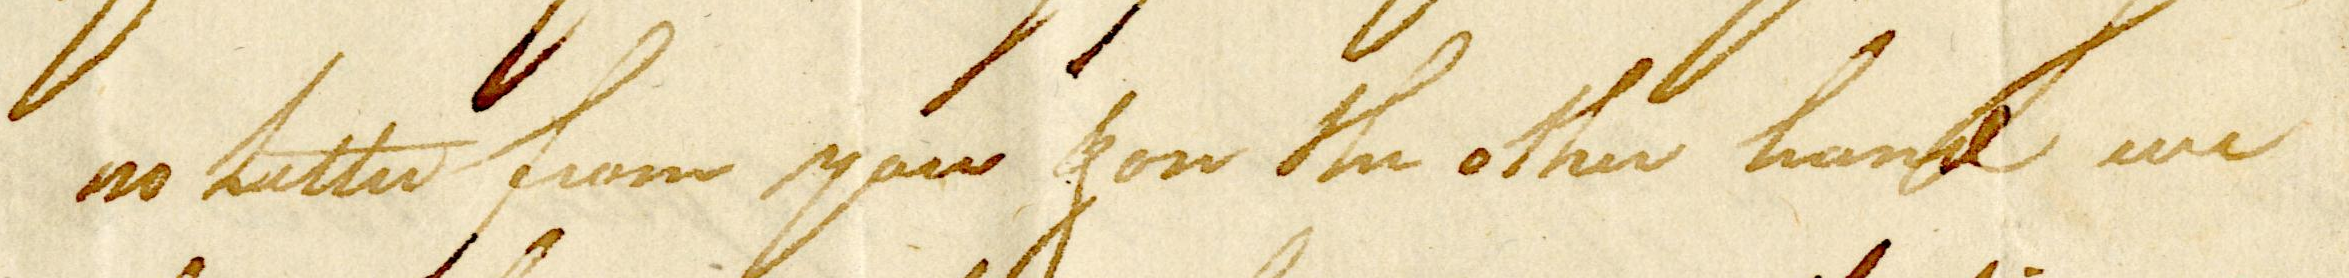no Letter from you & on the other hand we
